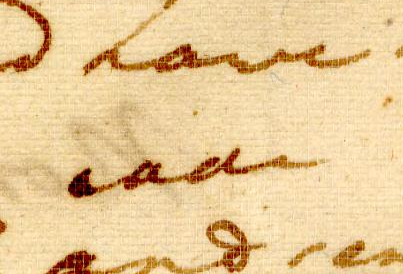each
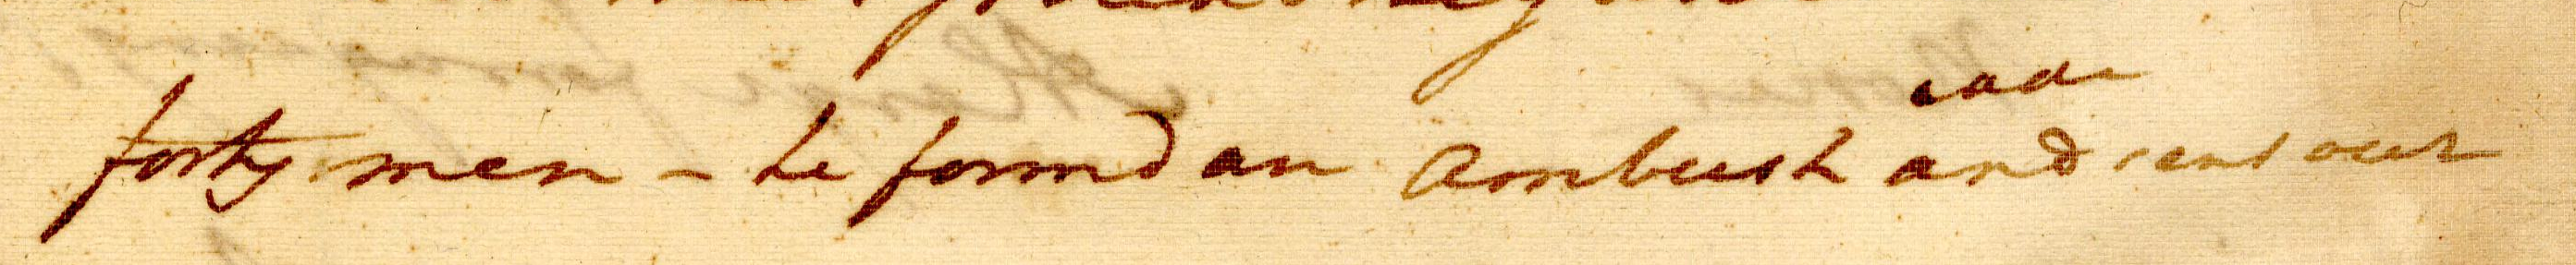forty men- he formd an ambush and sent out
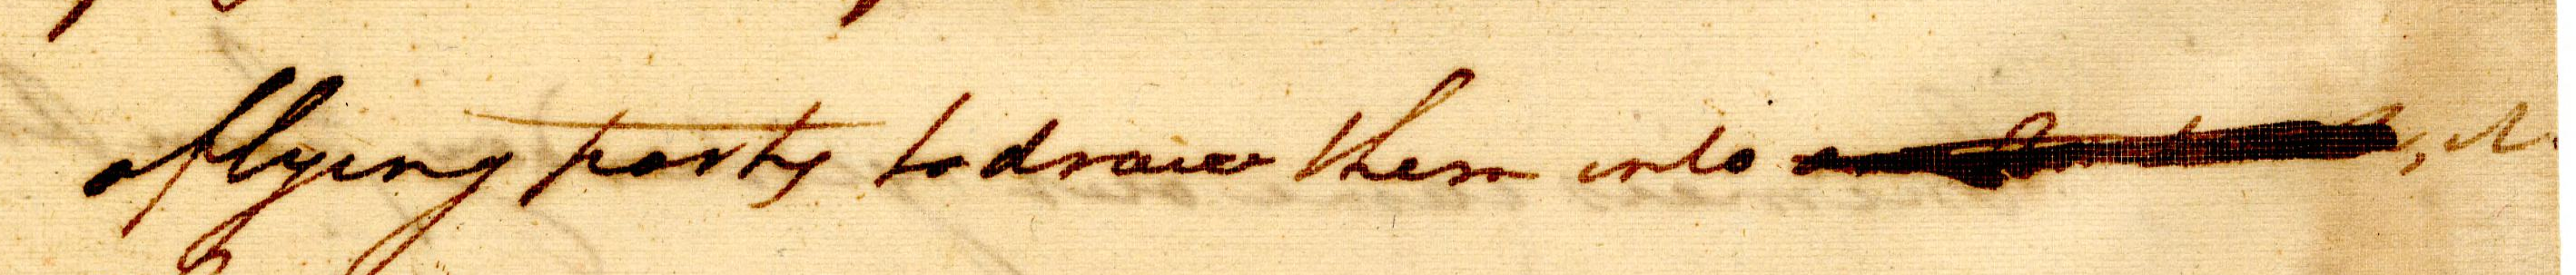a flying party to draw them into [________] it
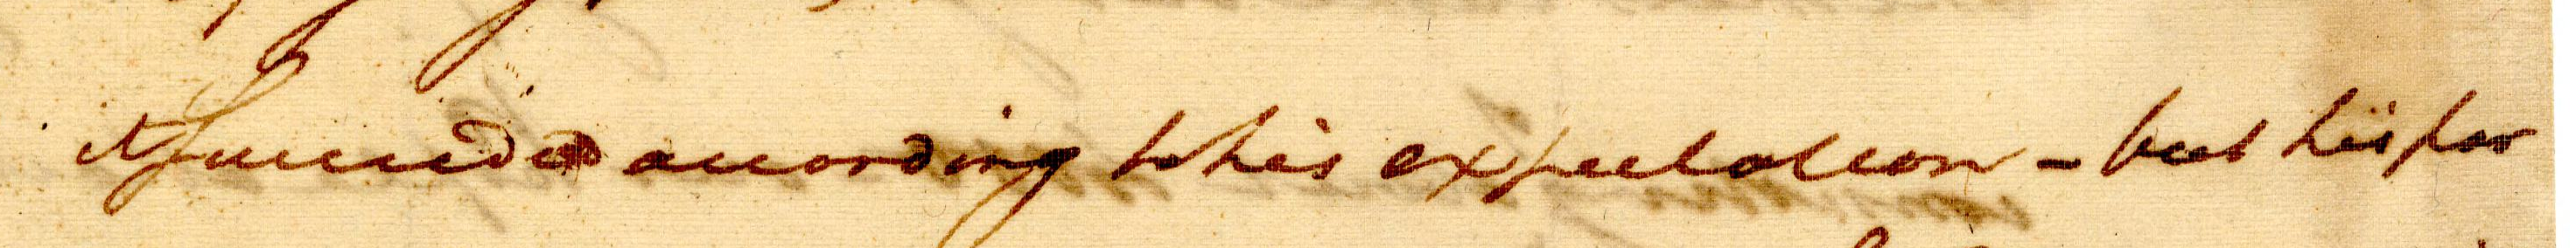it Succeeded according to his expectation- but his par
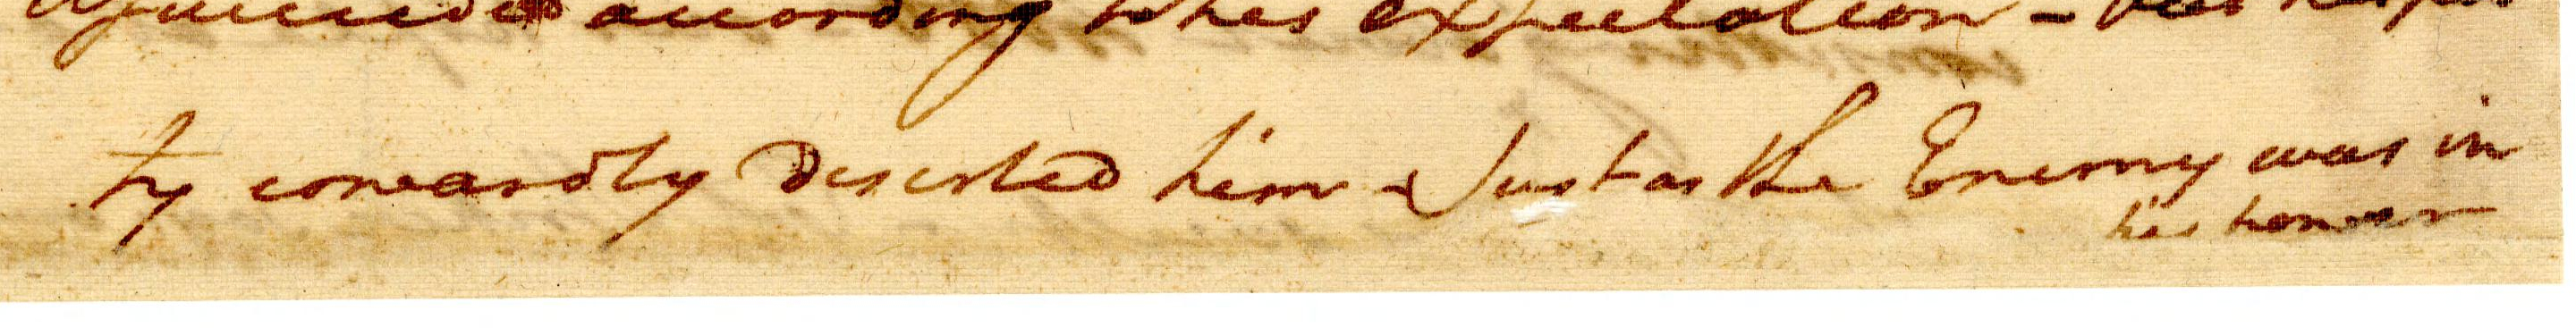ty cowardly deserted him. Just as the Enemy was in
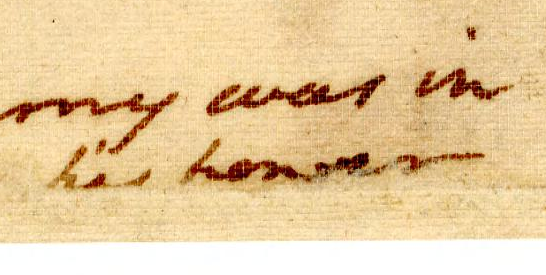his power
